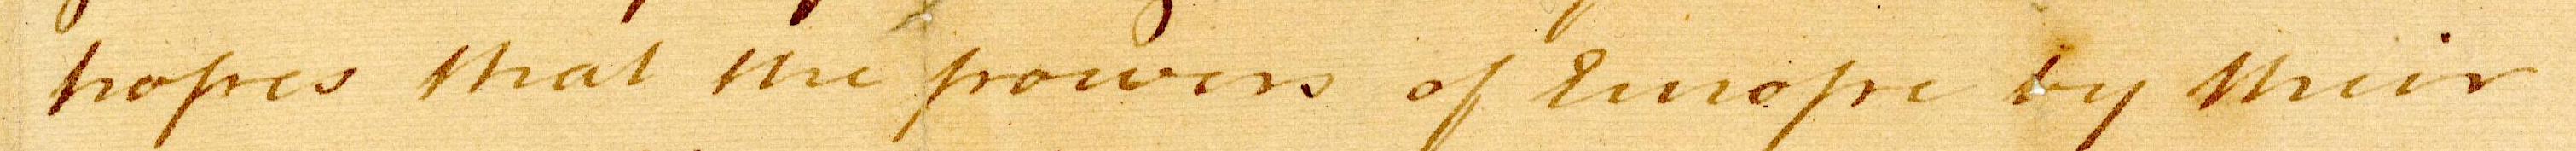hopes that the powers of Europe by their
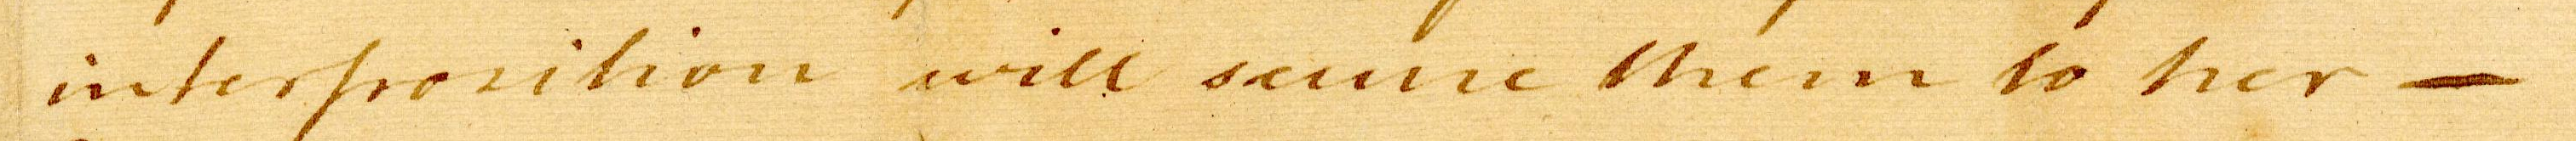interposition will secure them to her-
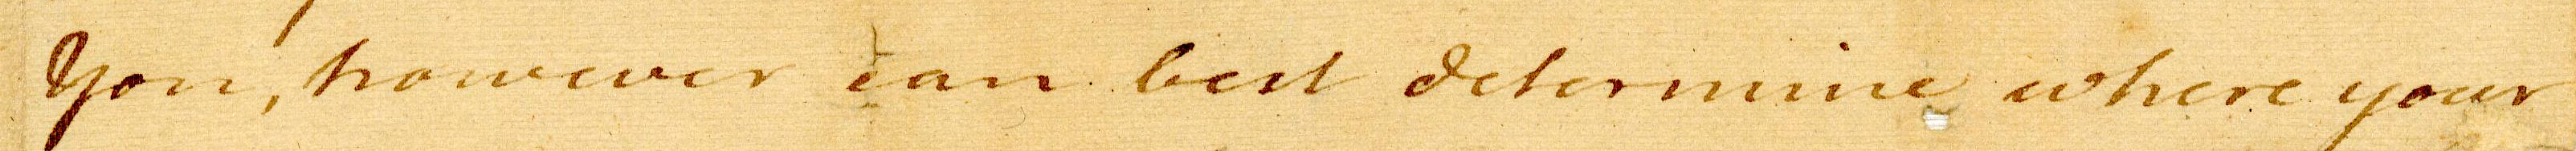You, however can best determine where your
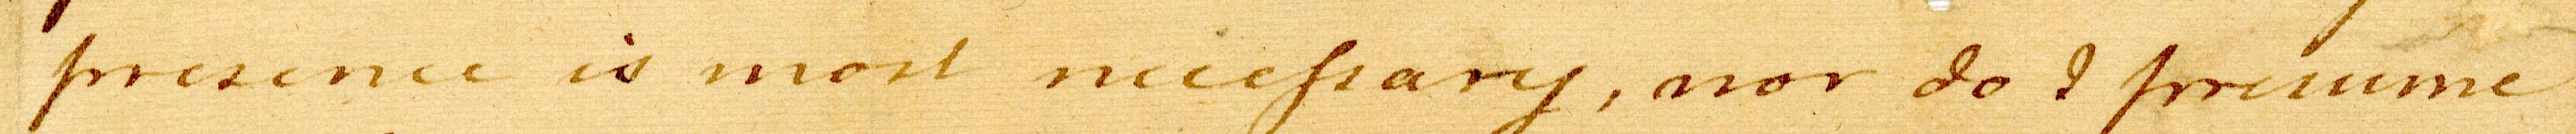presence is most necessary, nor do I presume
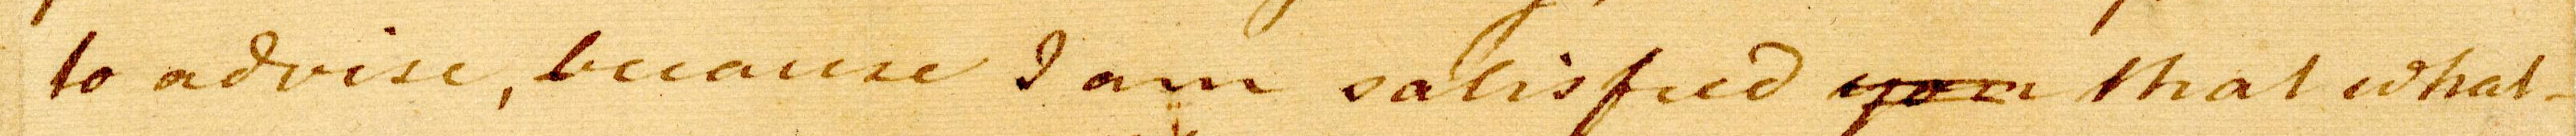to advise, because I am satisfied [you] that what
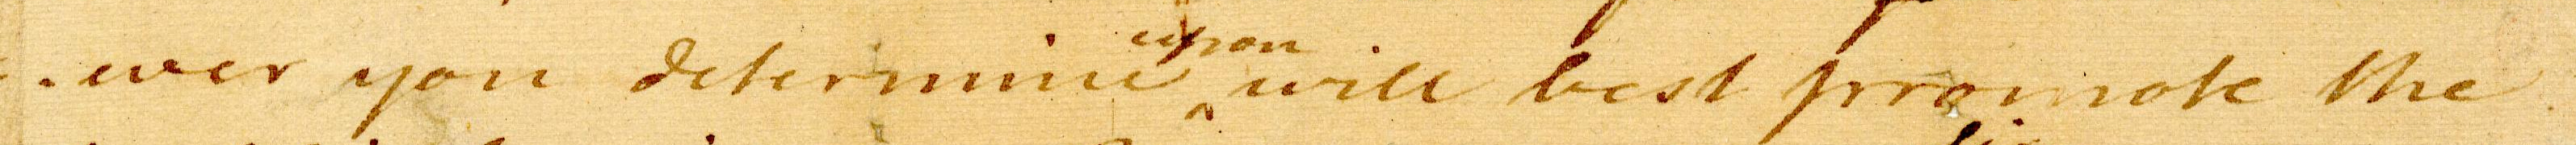-ever you determine ^ will best promote the
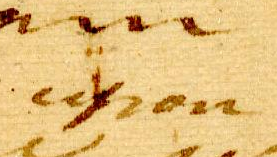upon
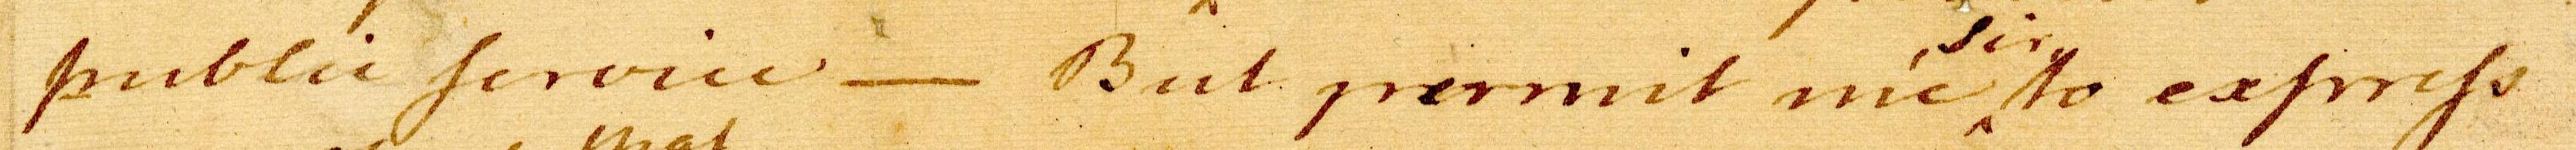public service- But permit me ^ to express
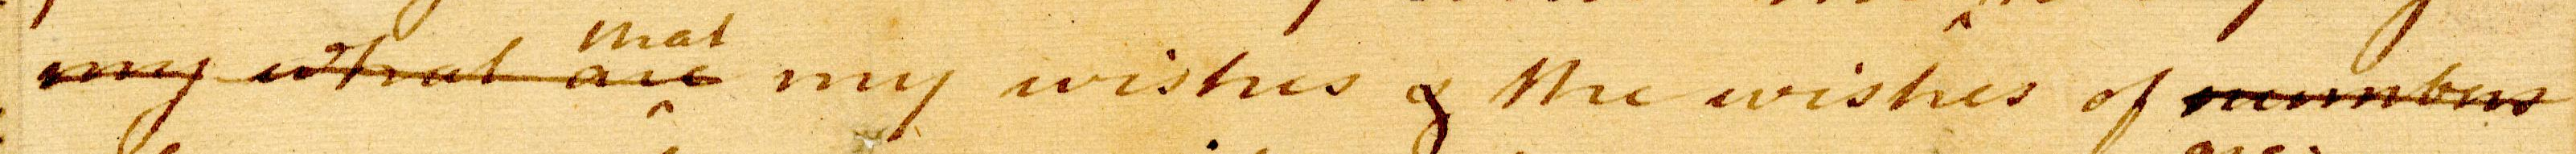[my what are] my wishes & the wishes of [numbers]
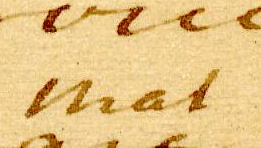that
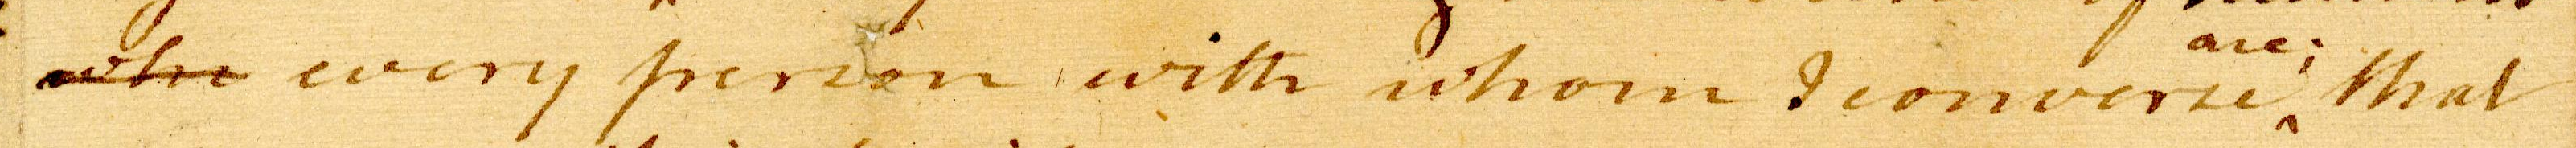[whi] every person with whom I converse ^ that
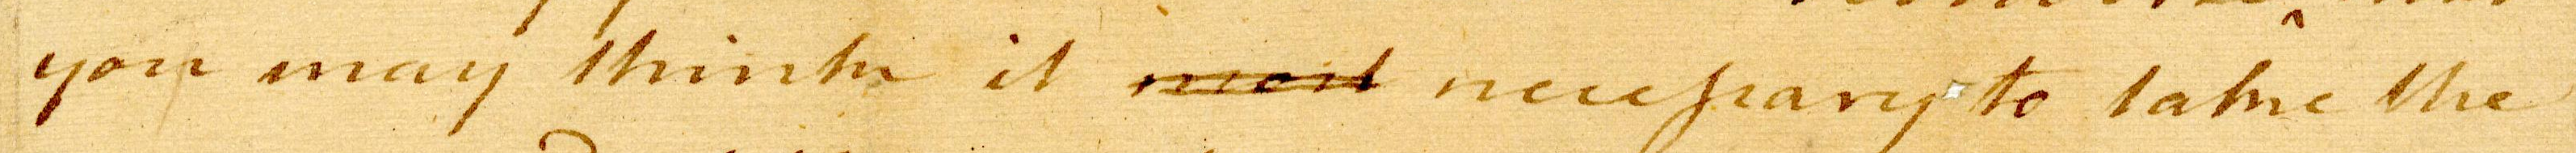You may think it [most] necessary to take the
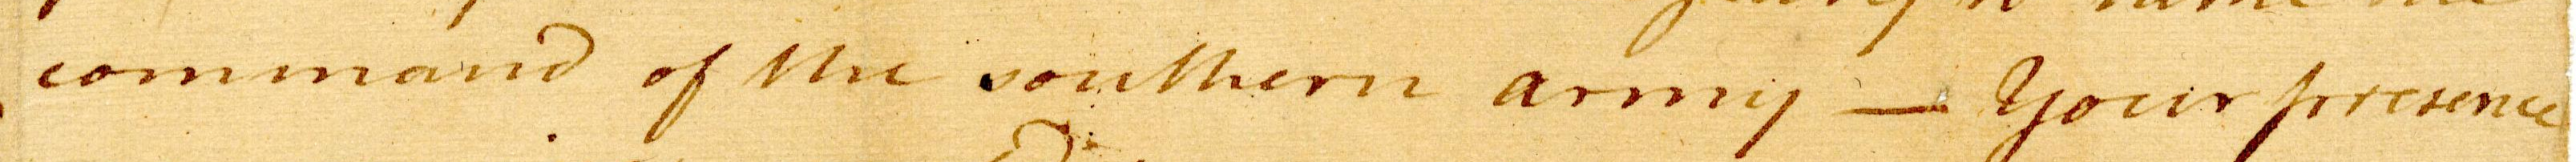command of the southern army- Your presence
